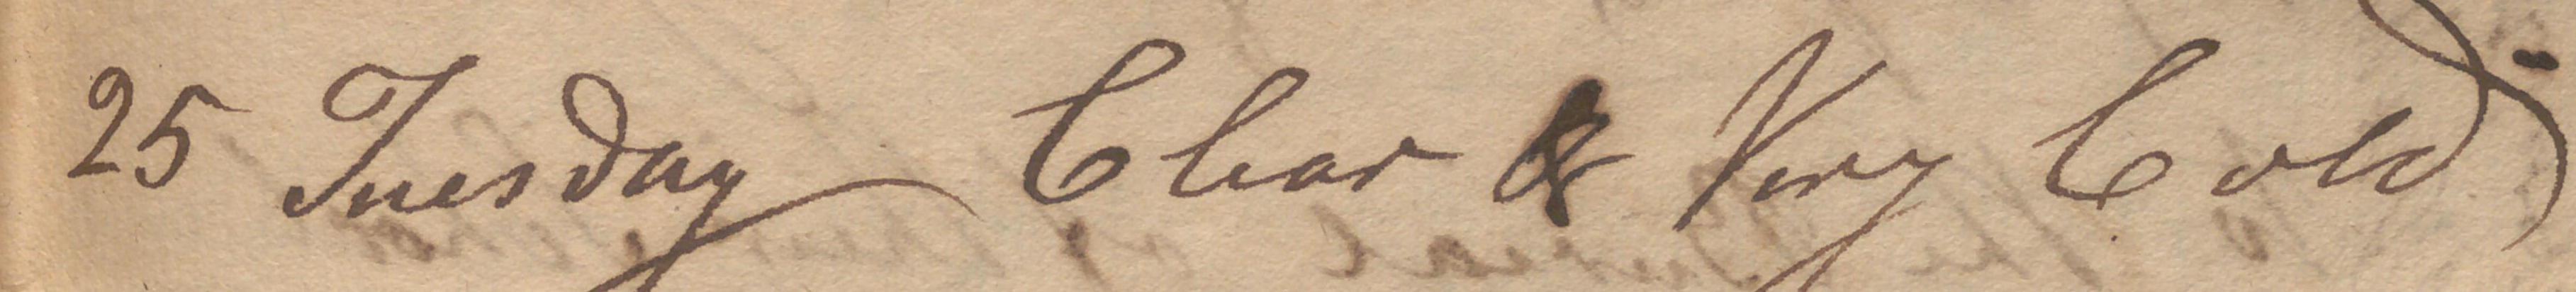25 Tuesday- Clear & Very Cold
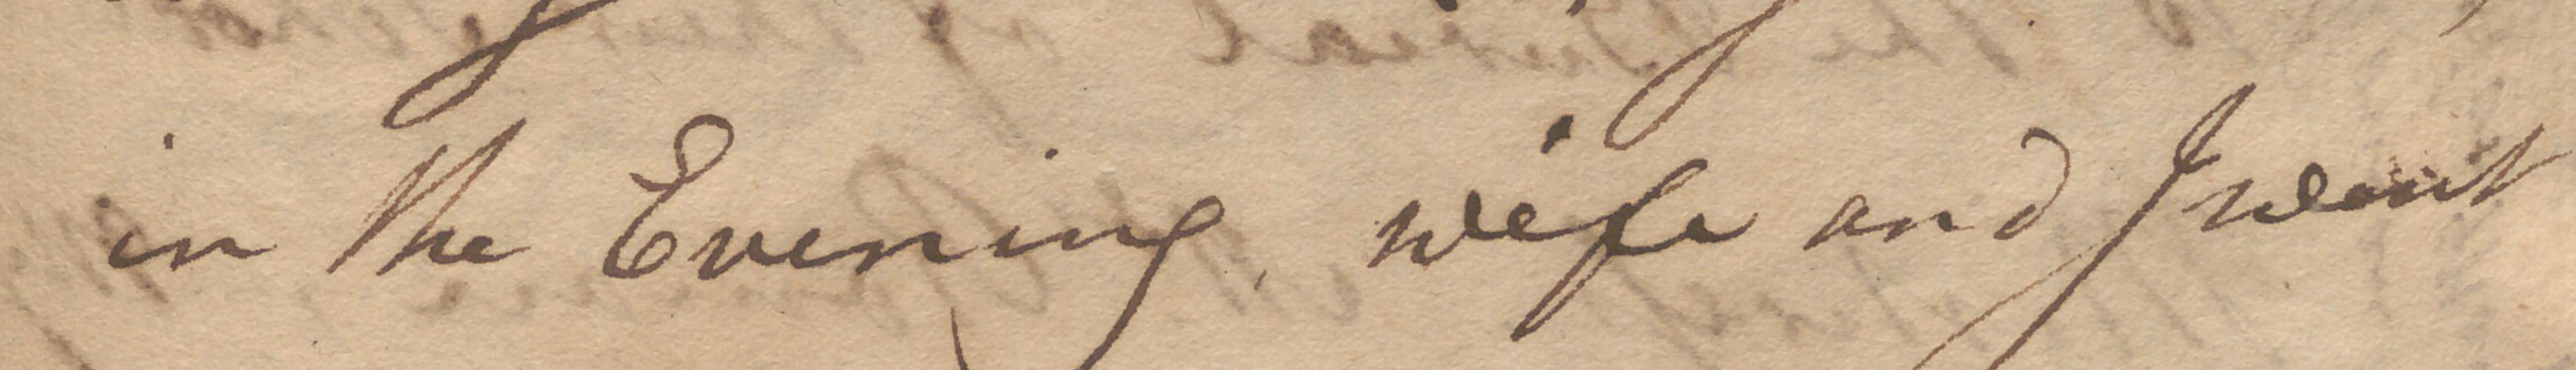in the Evening wife and went
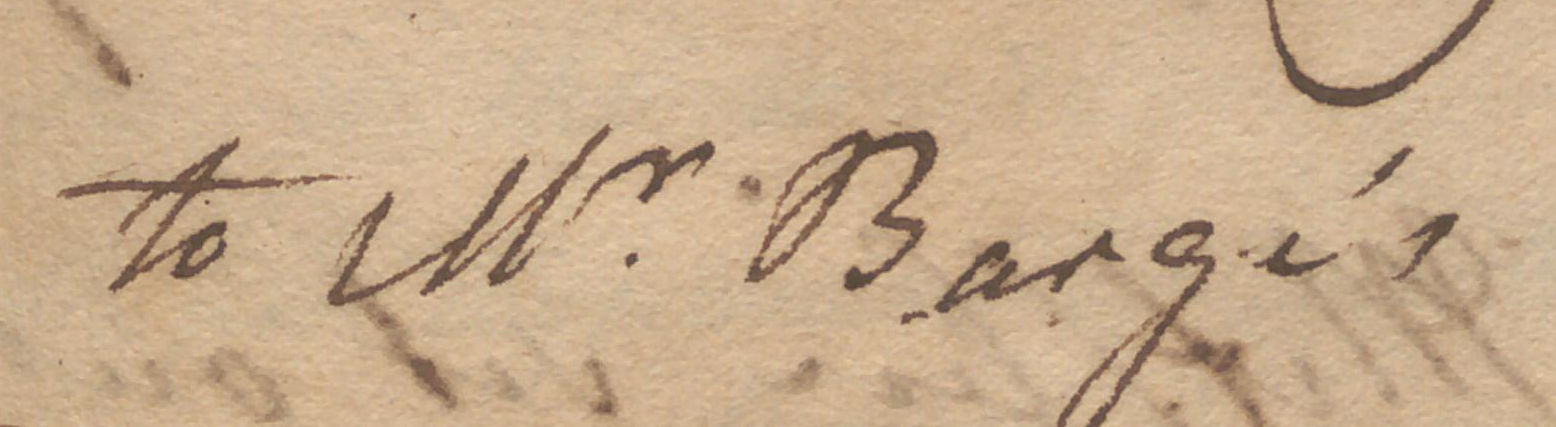to M^r. Barges
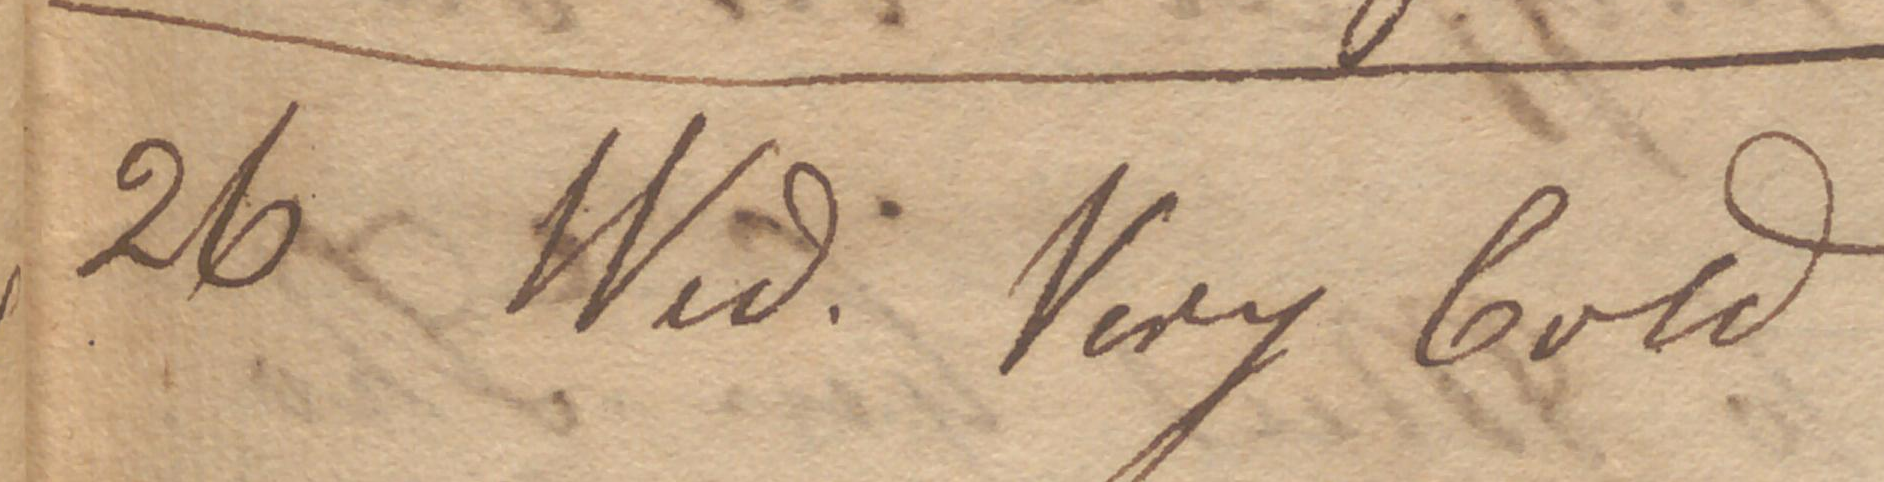26 Wed. Very Cold
